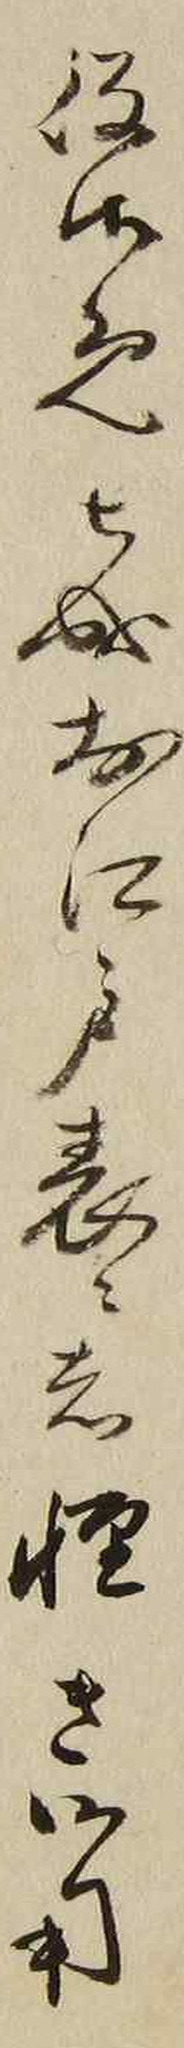役御免被成於江戸表には軽き御用
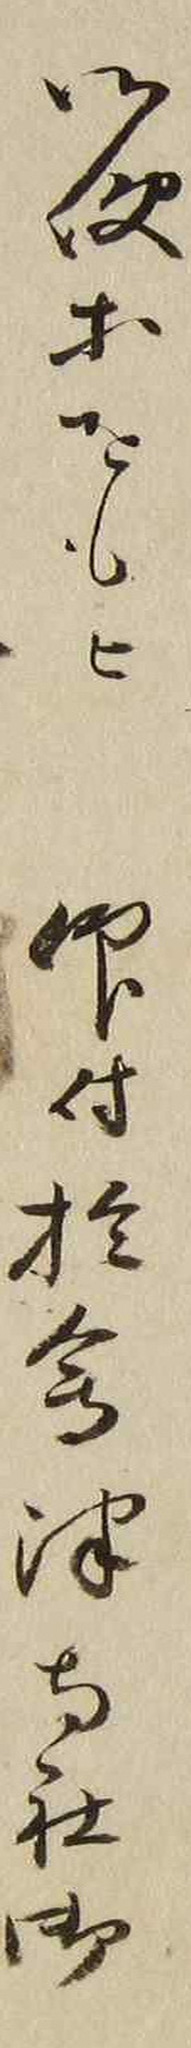御使等をも被仰付於会津寺社御
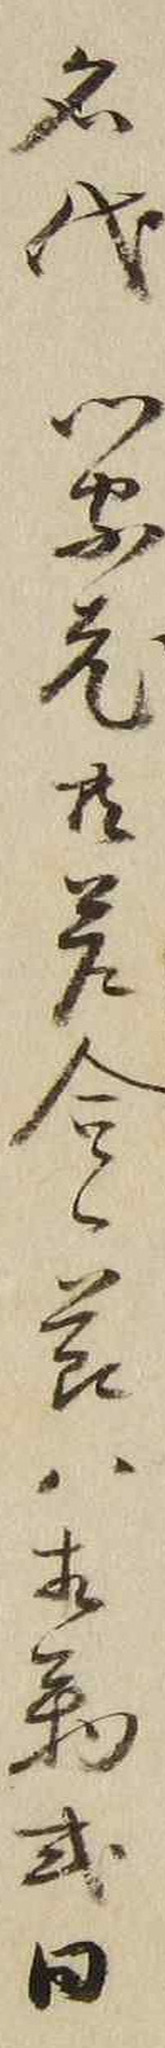名代御家老共差合候節は相勤式日
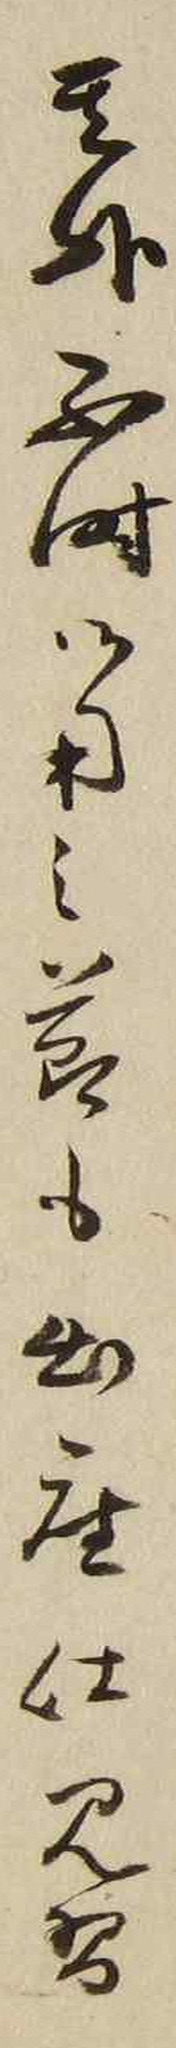其外不時御用之節も出座仕見習

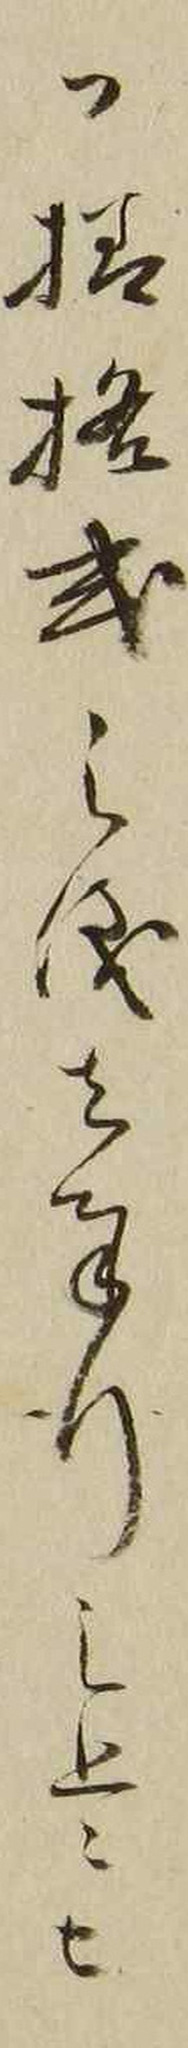候様格式之儀は奉行之上に被
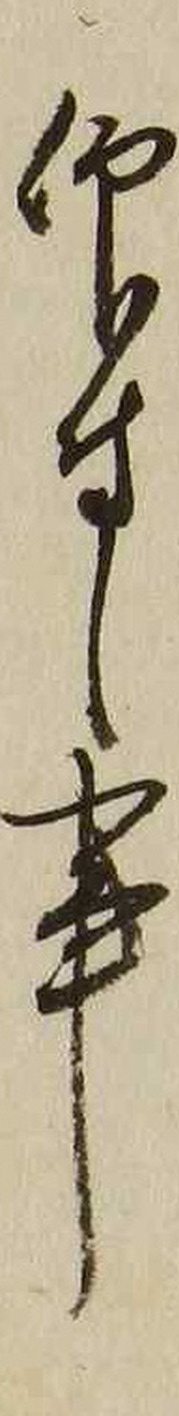仰付候事
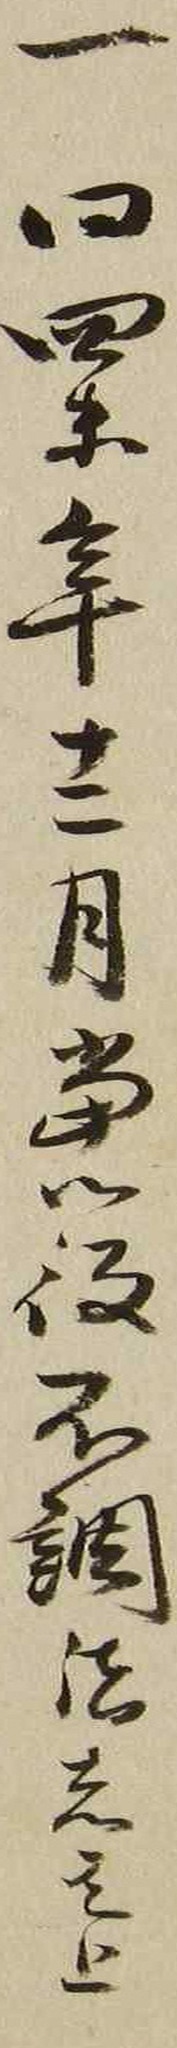一同四未年十二月当御役不調法者之上
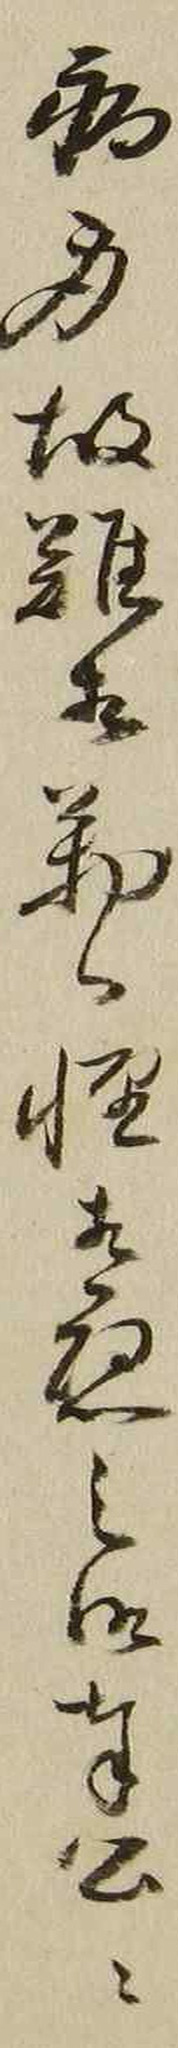病身故難相勤候軽相応之御奉公に
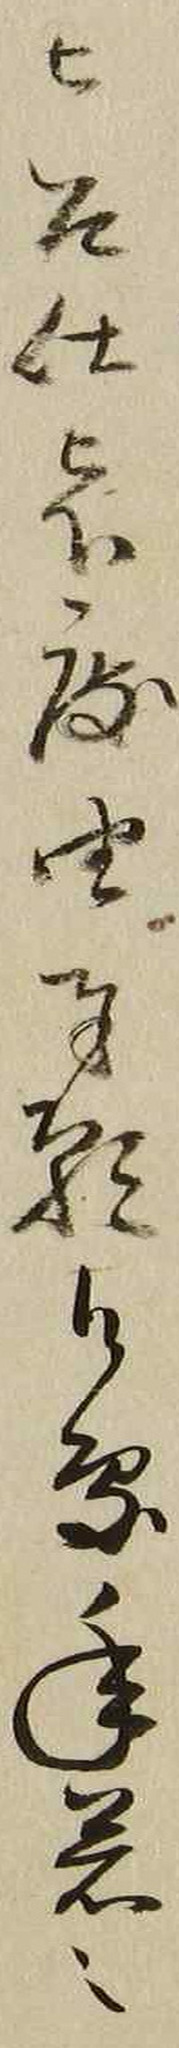被召仕被下度由奉願候処年若之
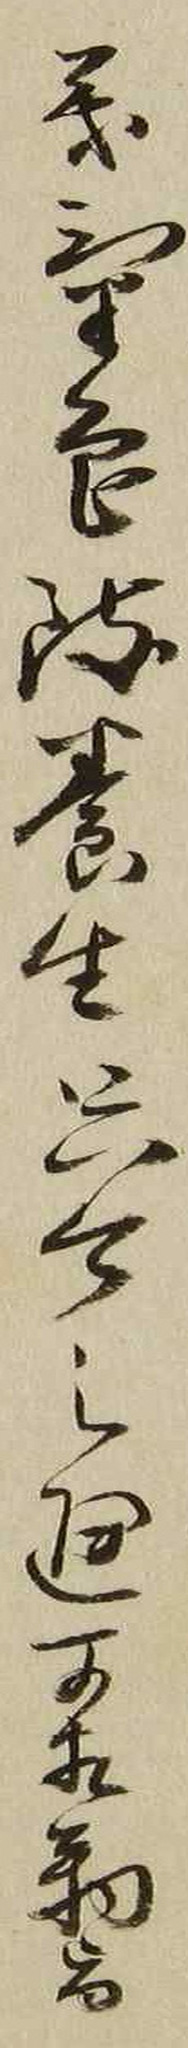義気色致養生只今之通可相勤旨
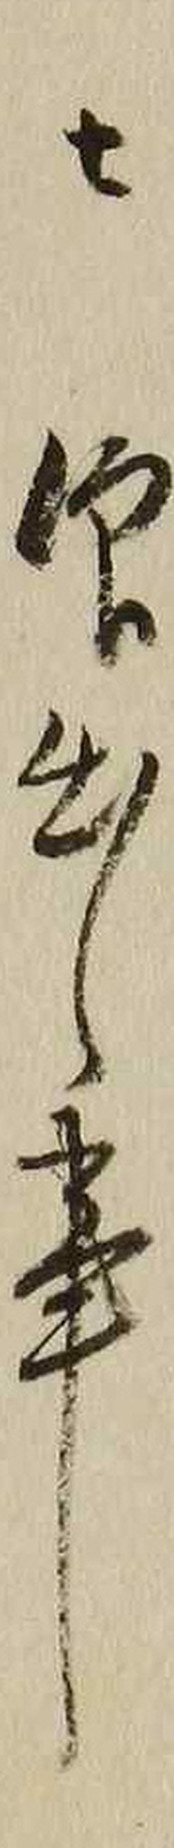被仰出候事
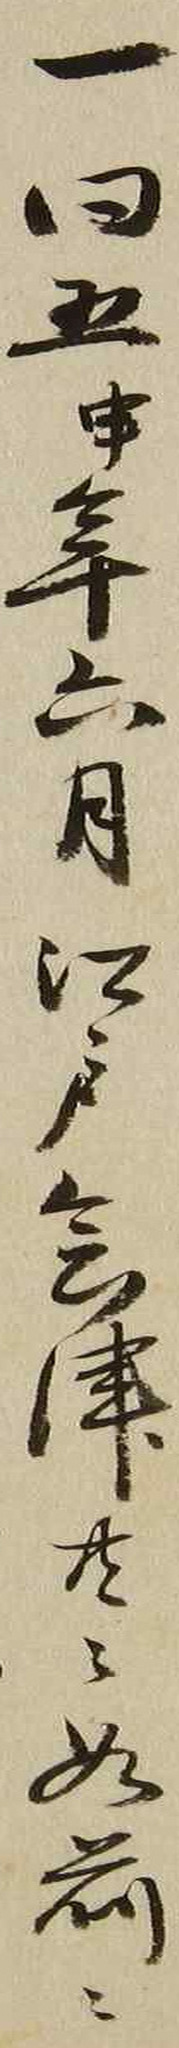一同五申年六月江戸会津共に如前に
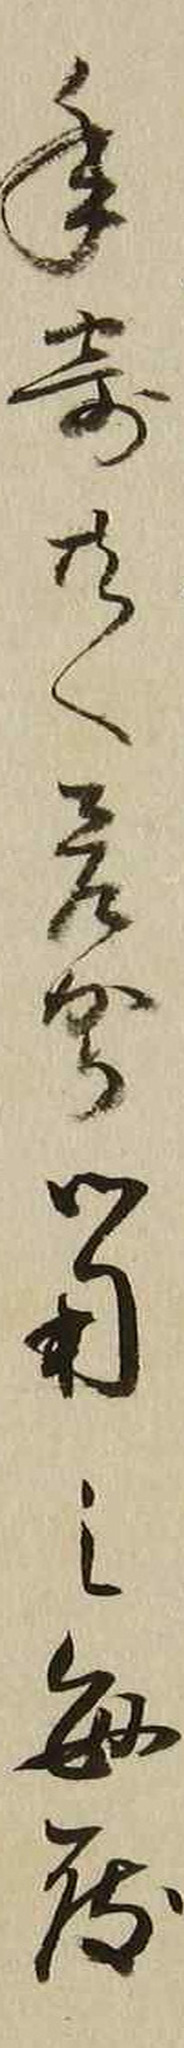年寄共へ差かり御用之毎度
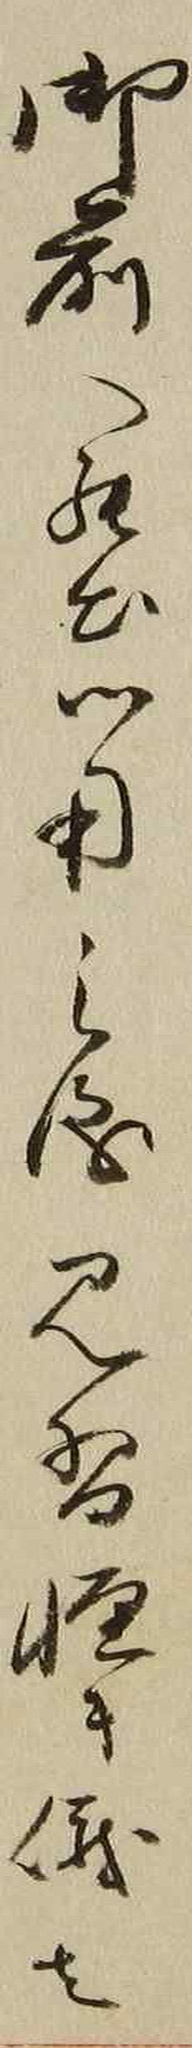御前へ罷出御用之儀見習軽き儀は
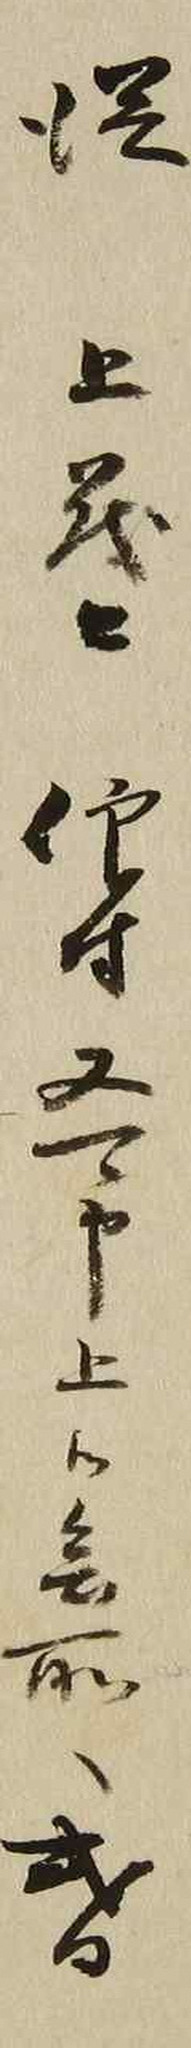従上も被仰付又可申上候会所へ式日
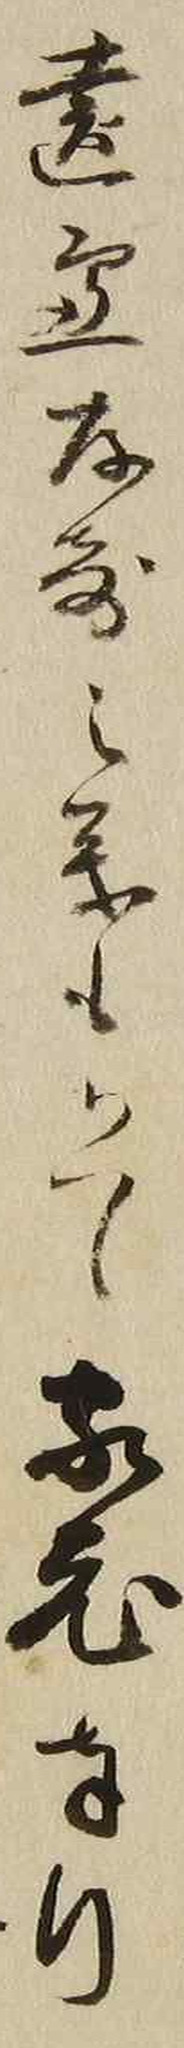遠慮存寄之義も候はゝ家老奉行
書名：諸士系譜　巻之269　さ之部1
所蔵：会津若松市立会津図書館
